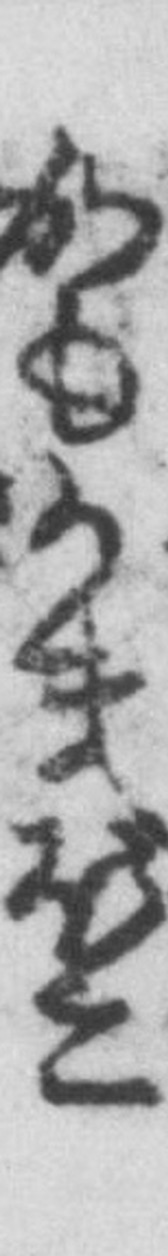五かもかまぼこ
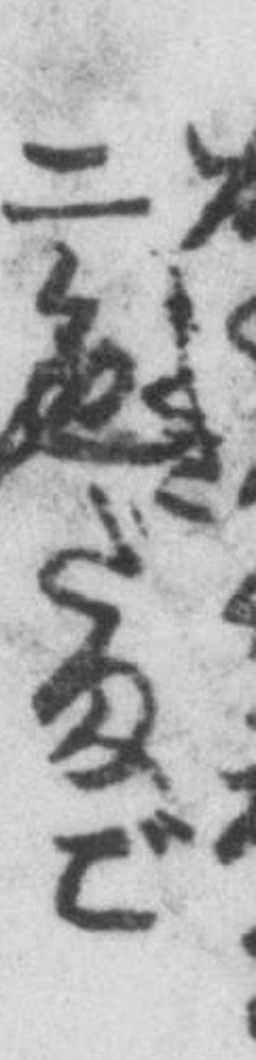二色たまご
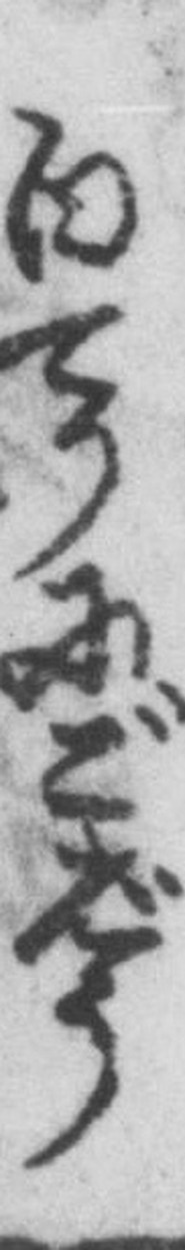色白てり煮ごぼう
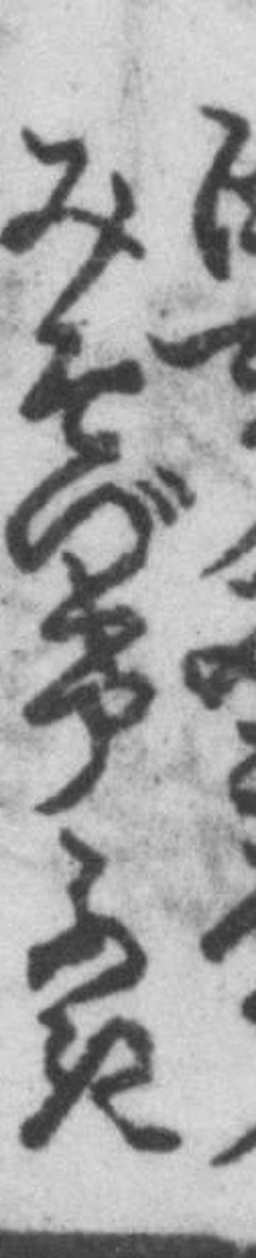みそづけふき
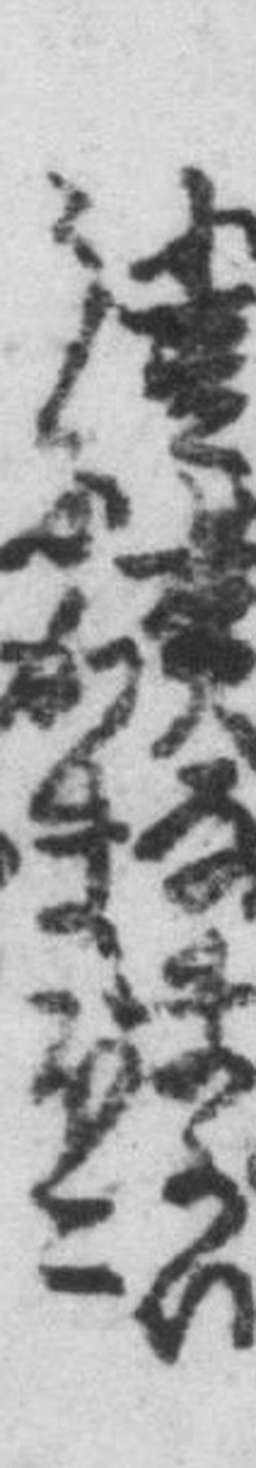まきかまぼこ
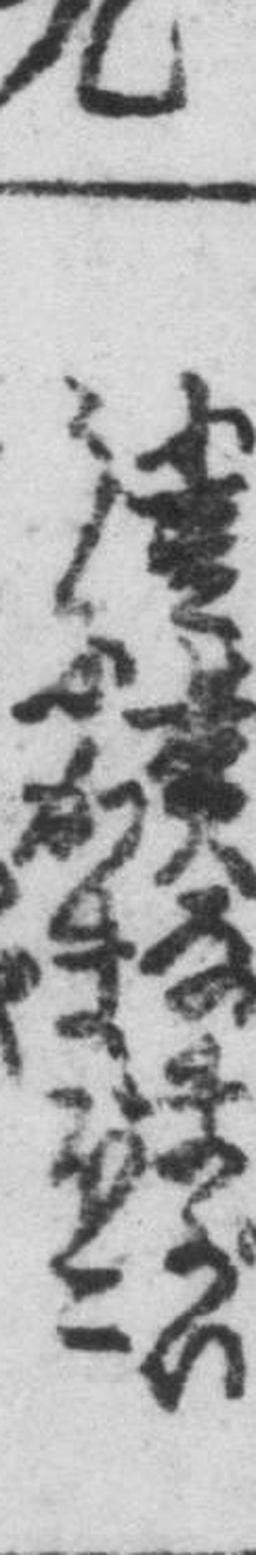まきかまぼこ
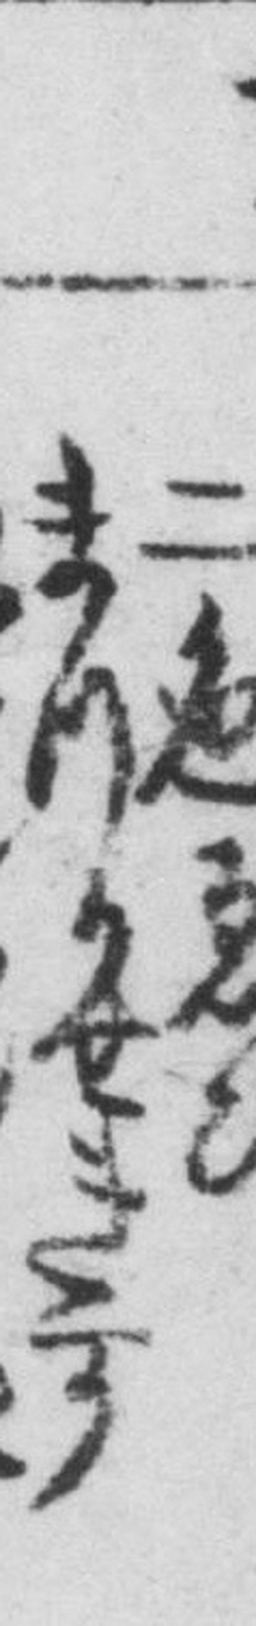まつかせきす
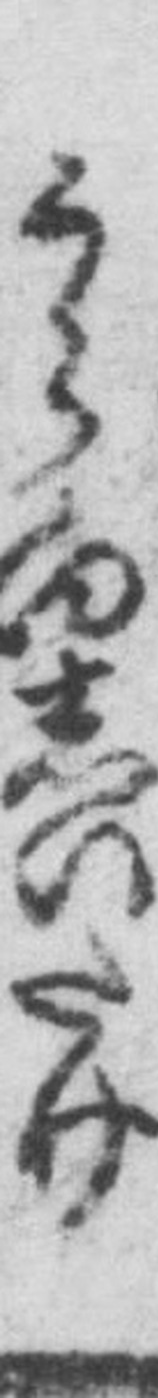うら白しいたけ
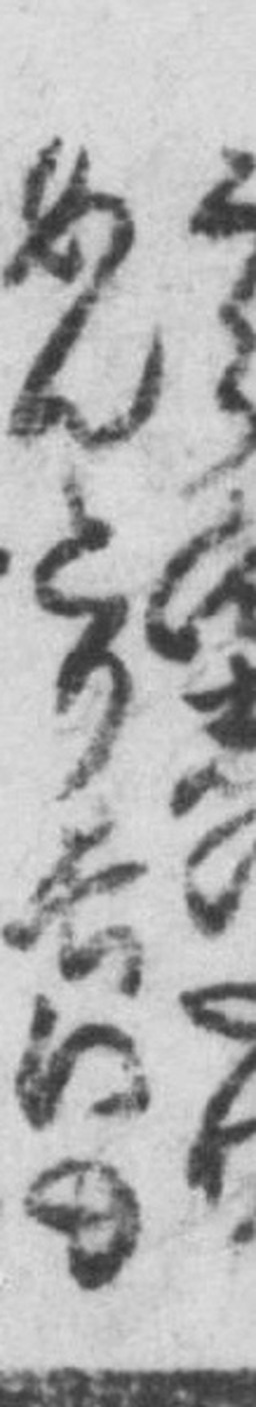色めんとり長いも
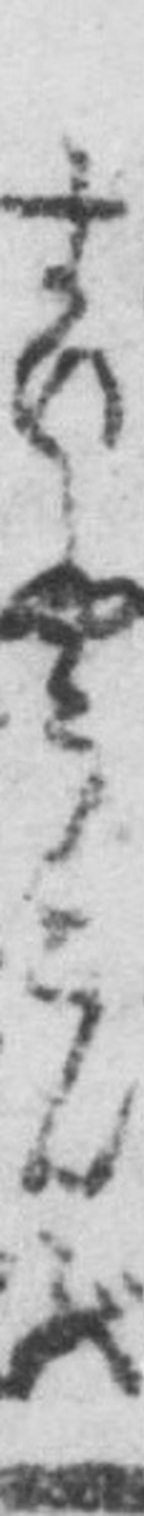すいしやうこんぶ
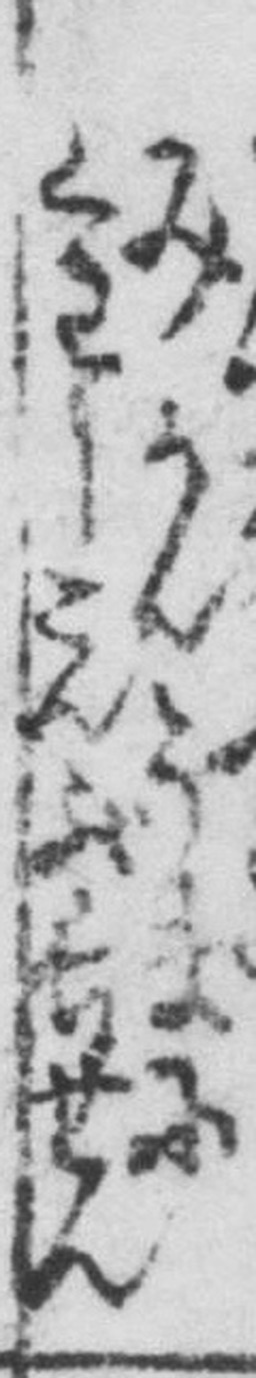くわしこんぶ長せん
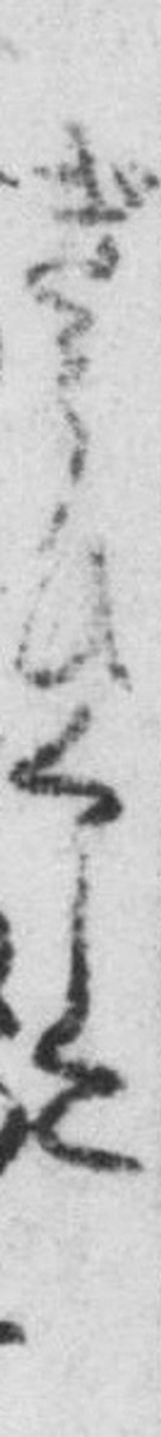ぎうひくしこ
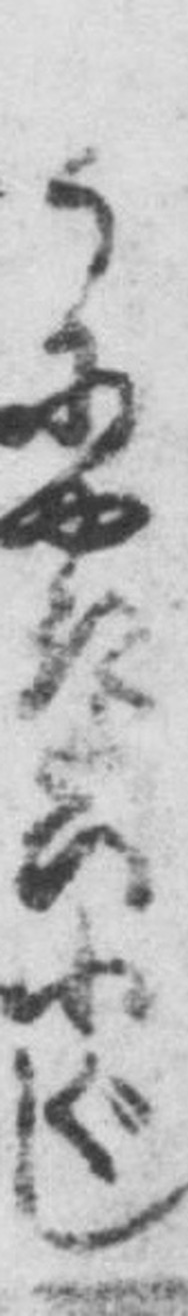うにやきたい小ぐし
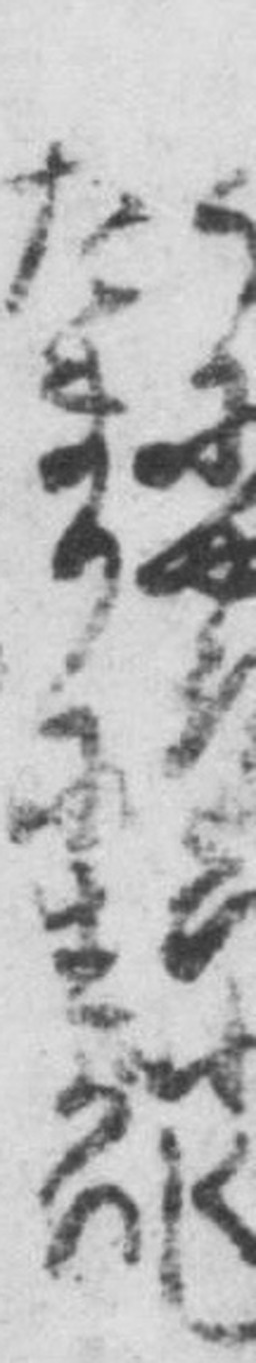たまりに生がい
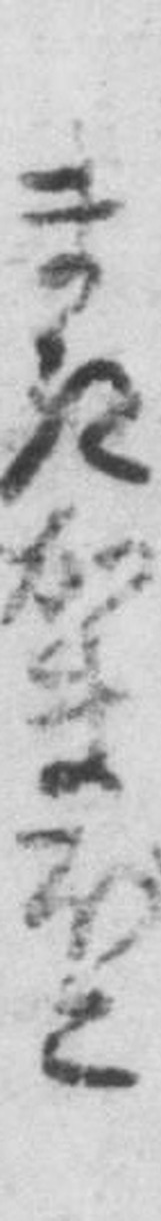まきかまぼこ
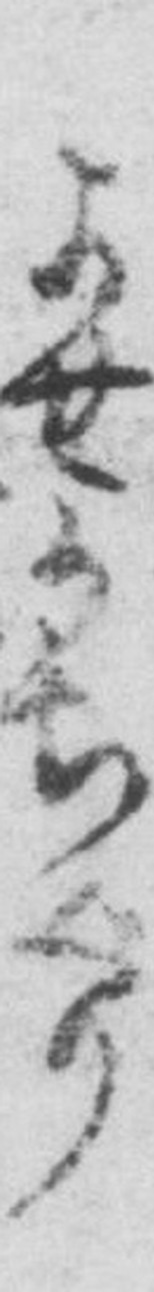色よせかちぐり
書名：即席庖丁
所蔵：大阪府立大学学術情報センター 国文学研究資料館
